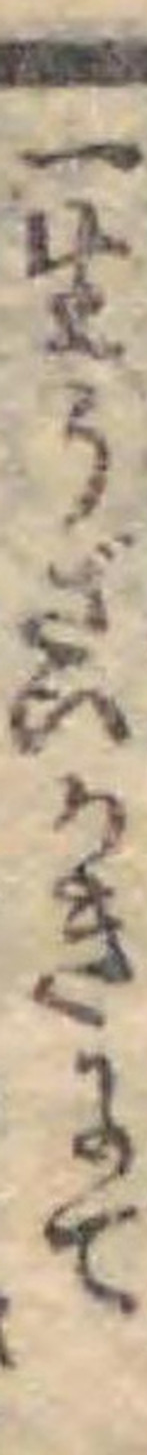一生かざいかきにて
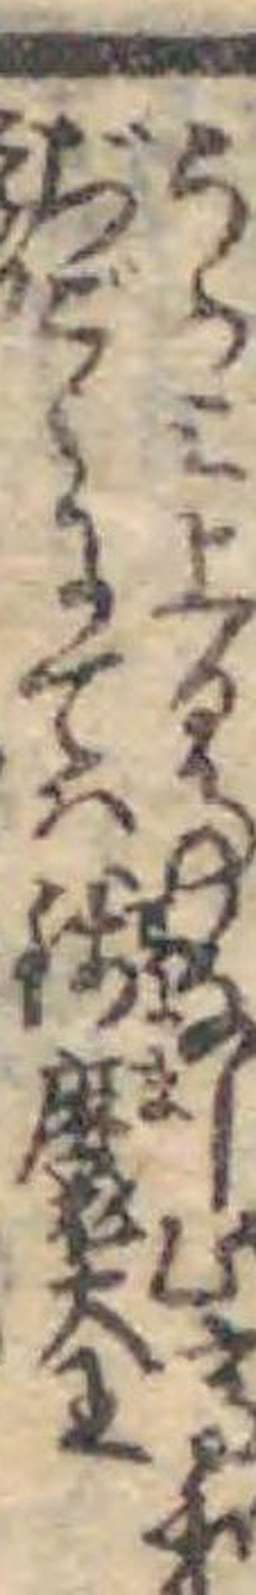ぢよくにては銭魔大王
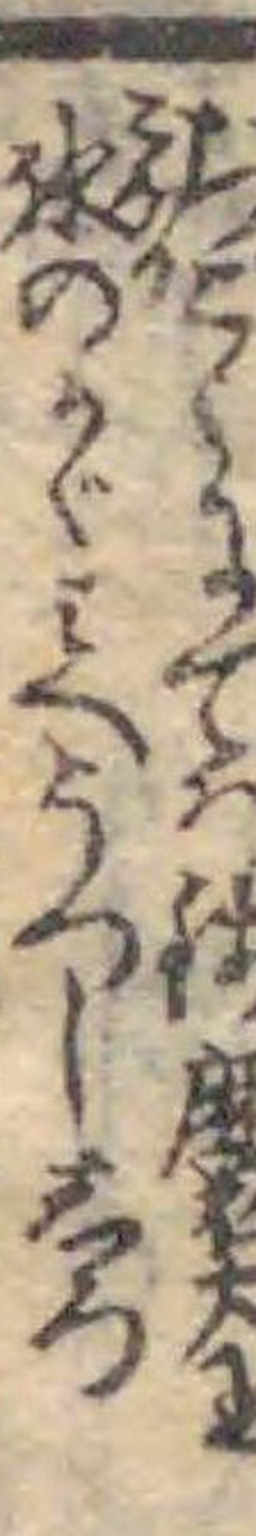氷のかゞみへうつししろ
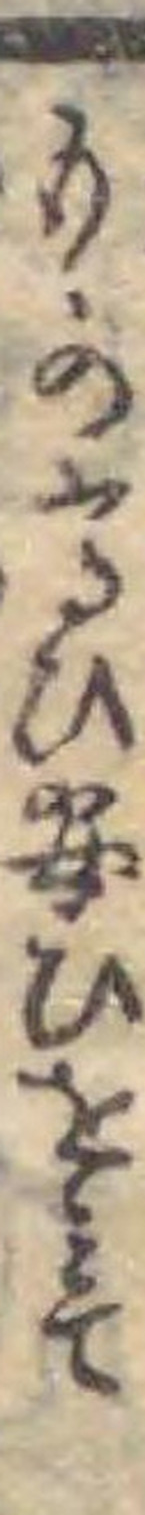もの高ひ安ひをみて
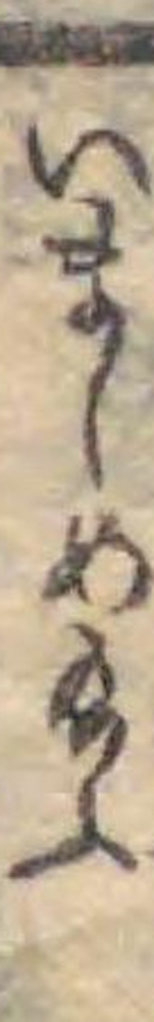いましめ給ふ
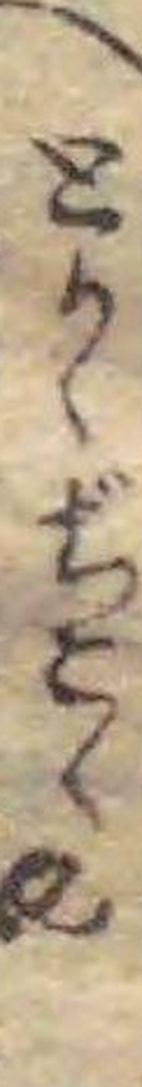とかくぢこくの
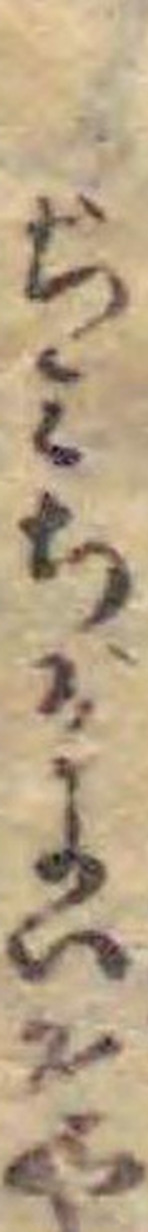ぢみちがよいぞや
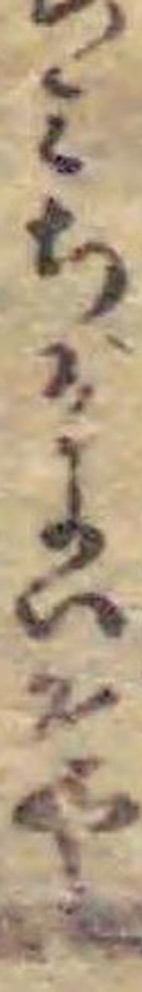ぢみちがよいぞや

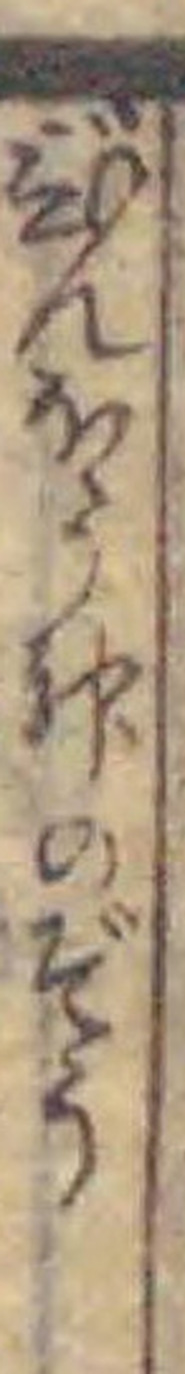びんぼう神のぞう
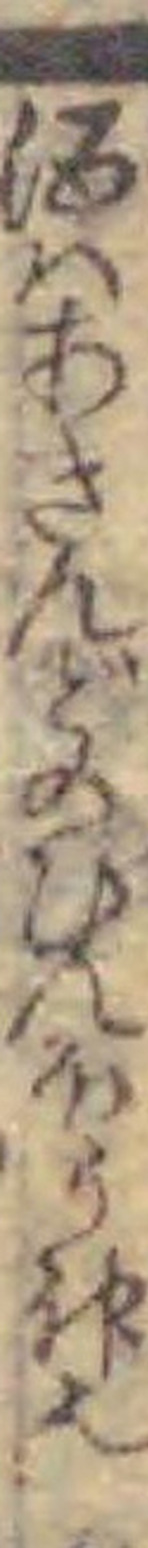酒はあきんどのびんほう神也
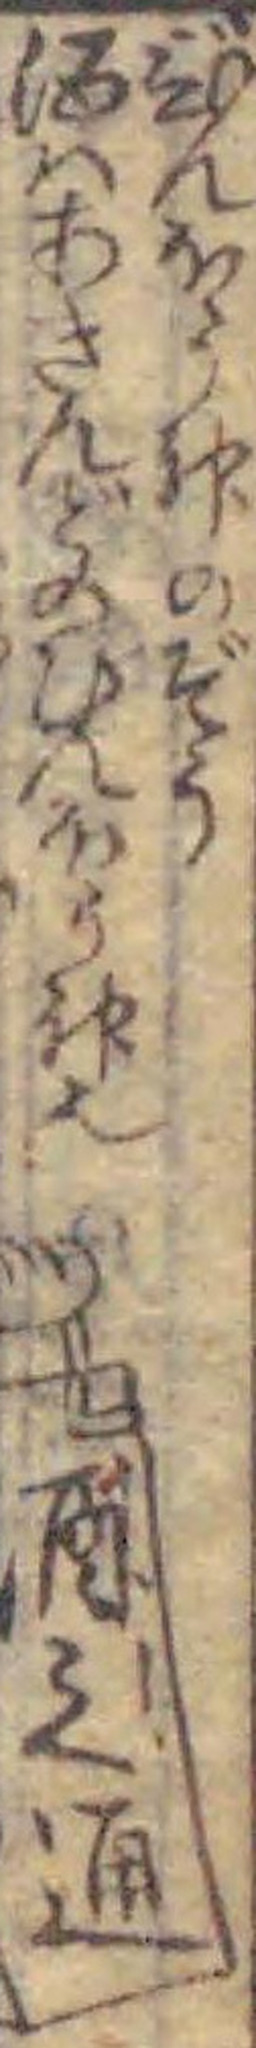酒はあきんどのびんほう神也
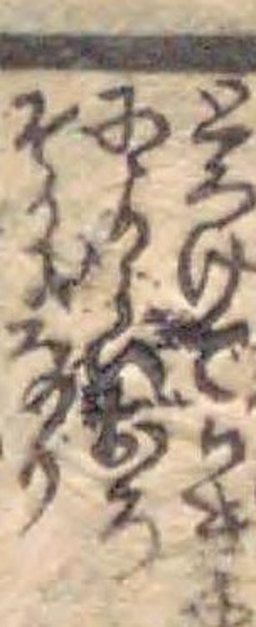によらいおろ
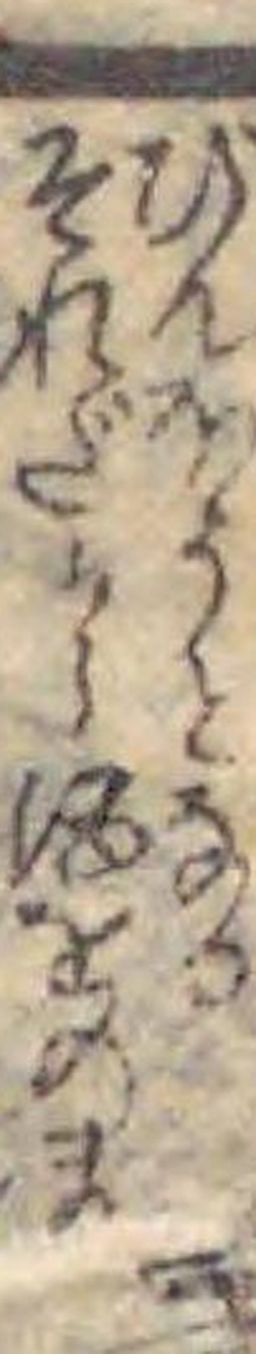それだから酒をのま
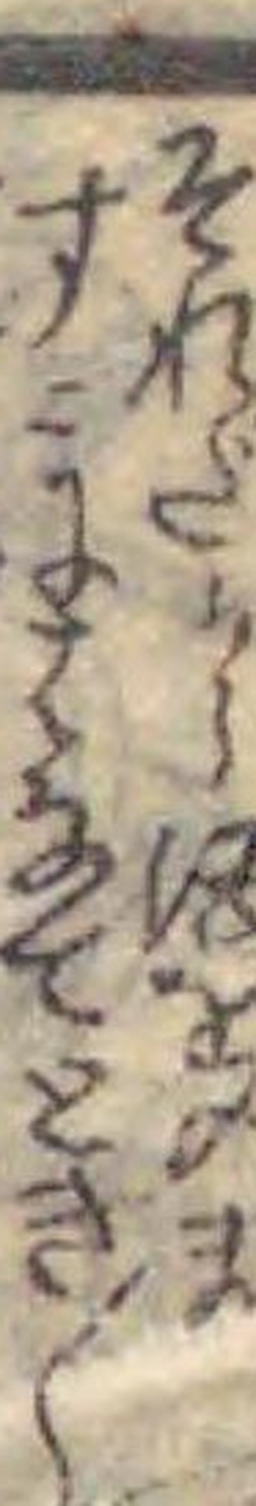すににはなてとき〳〵
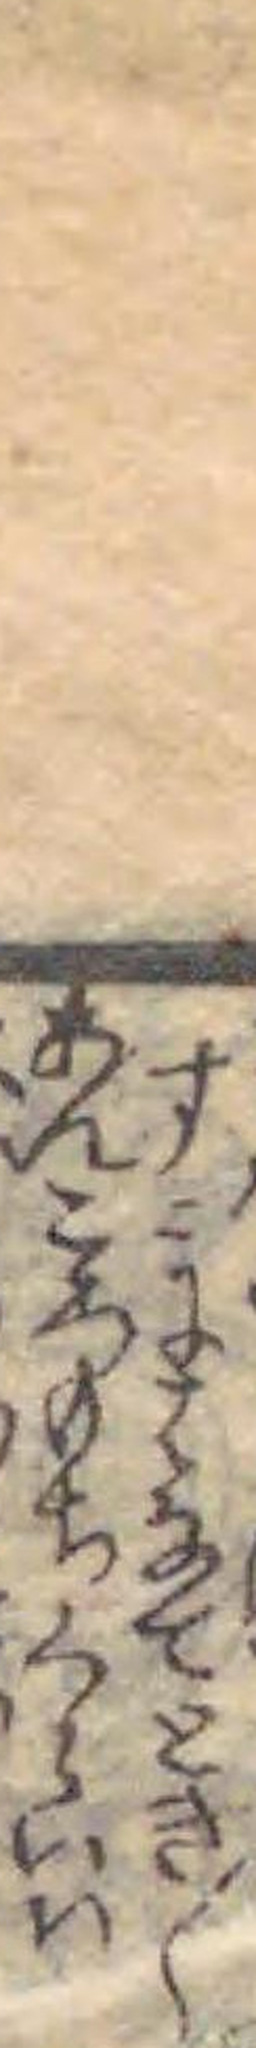あんころもちくらいは
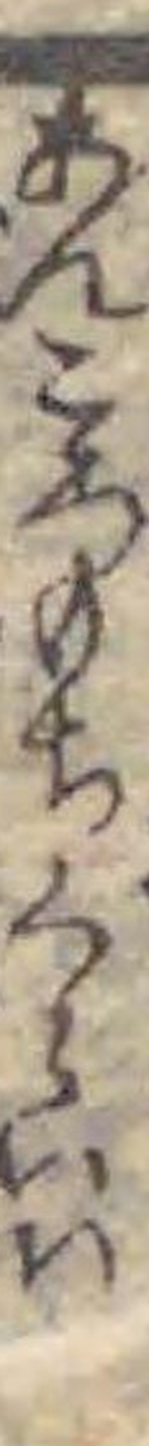あんころもちくらいは
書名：身体開帳略縁起 : 3巻
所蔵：国立国会図書館 National Diet Library, JAPAN
